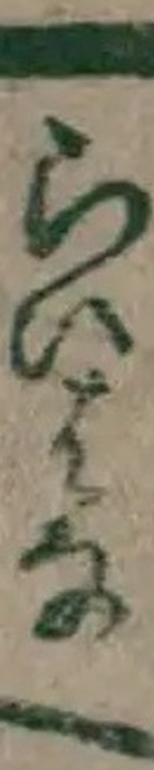らいはな
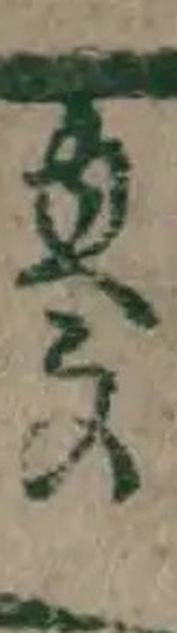ゆへこの
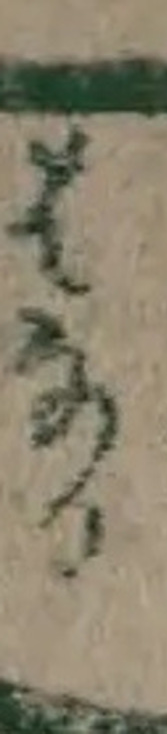はなか
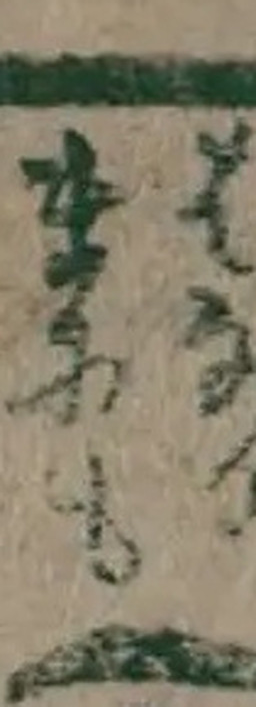まにも
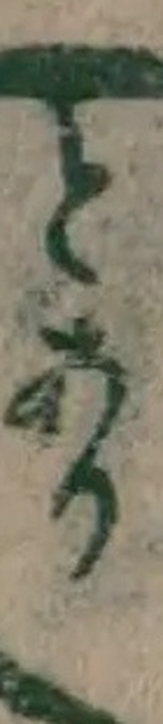とあり
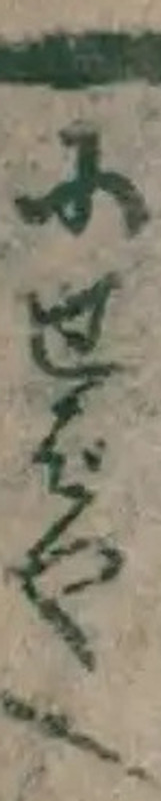にせばや
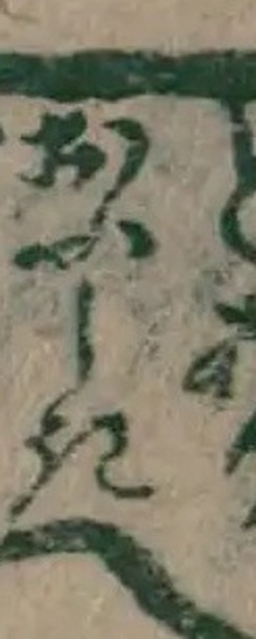おふしき
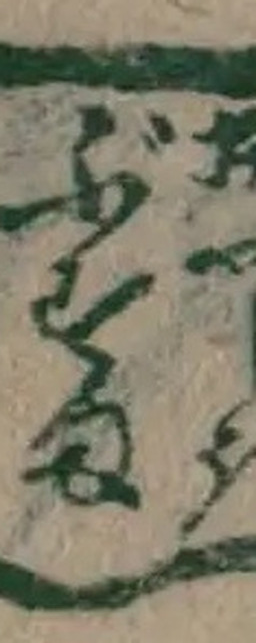ぶすま
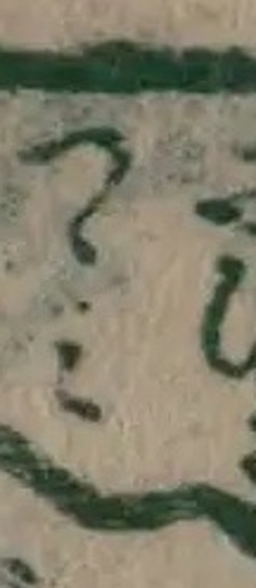つゝみ
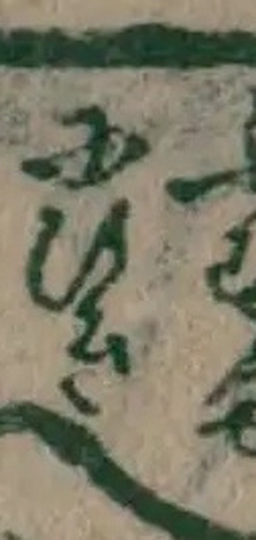にひき
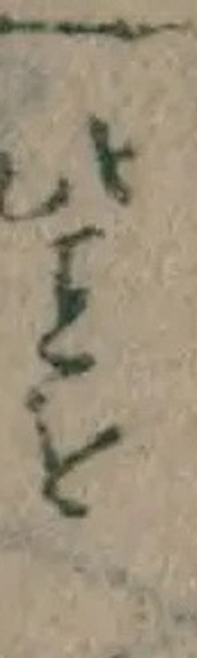此ことを
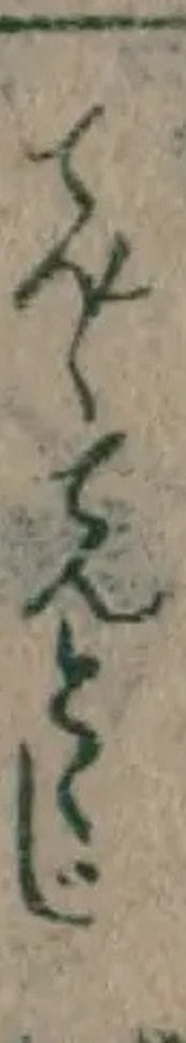てん〳〵てんとくじ
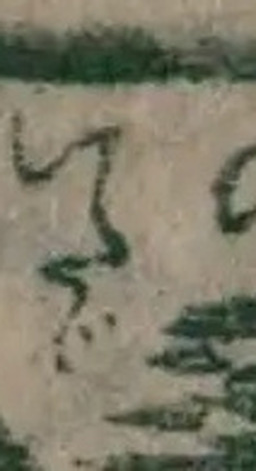いたゞ
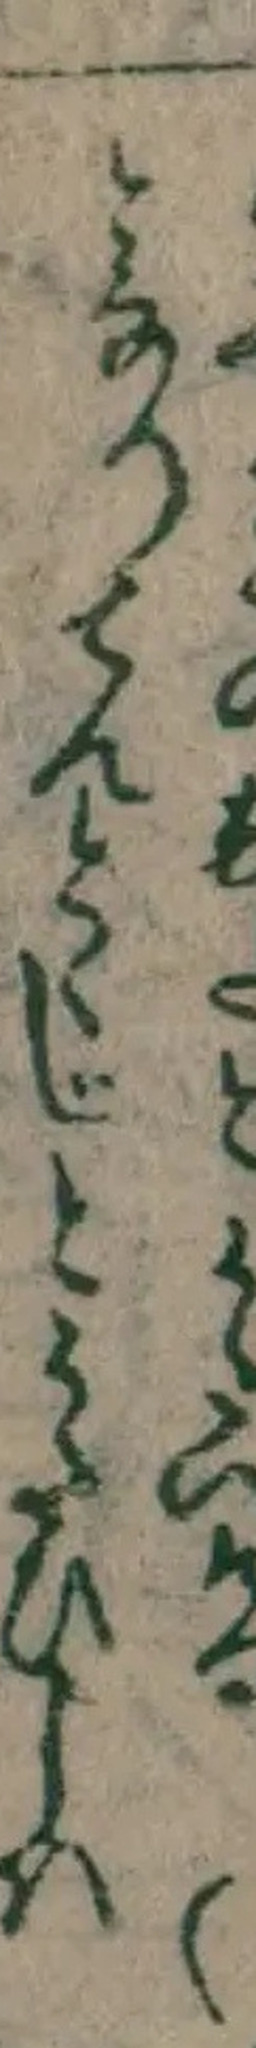となりてんとくじとうたひしは
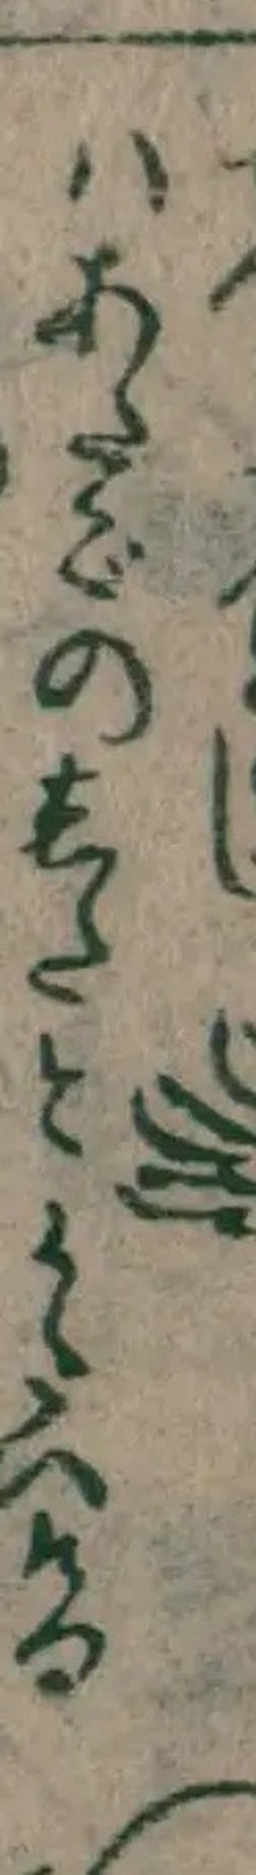はあたごのしたとうたいける
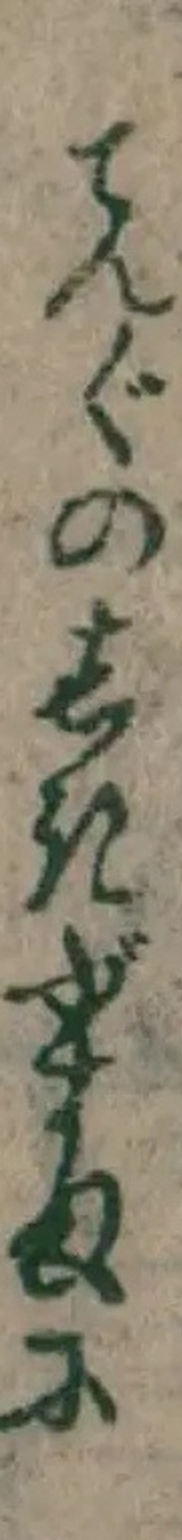てんぐのしきぶすまに
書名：頓作時雨月 3巻
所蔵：国立国会図書館 National Diet Library, JAPAN
